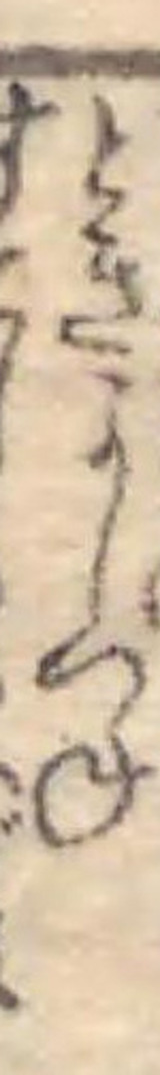ときよしつね
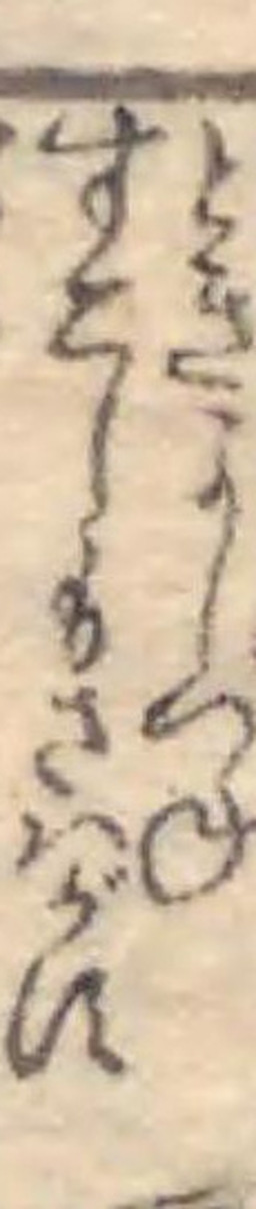すこしもさはがす
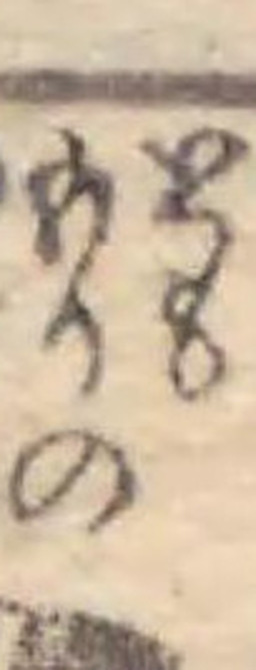もりの
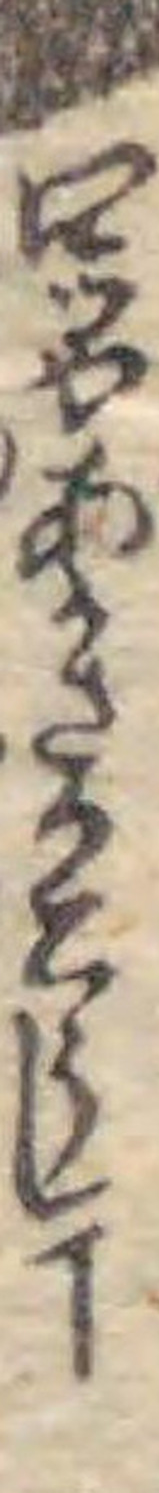四ツやあかさかこうし丁
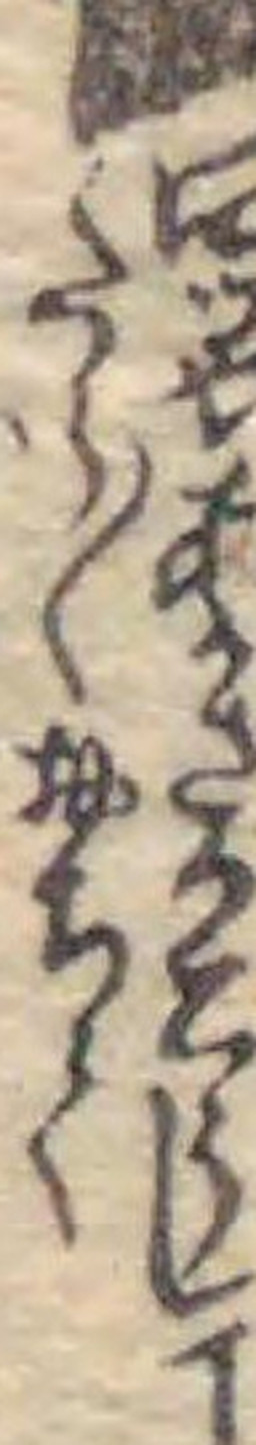たら〳〵おちて
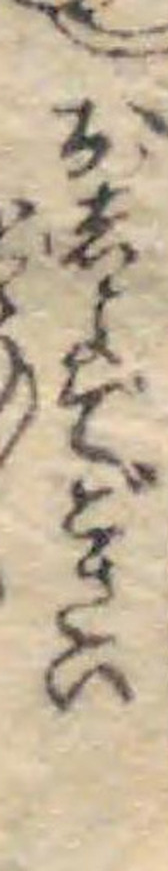おしよでごさい
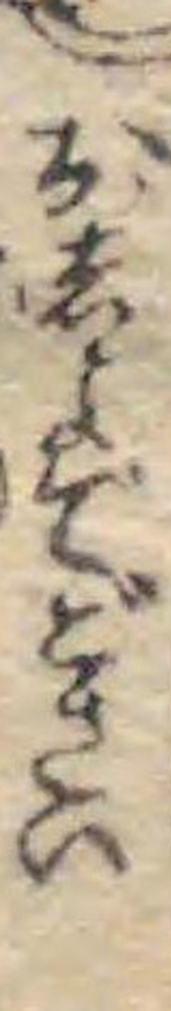おしよでごさい
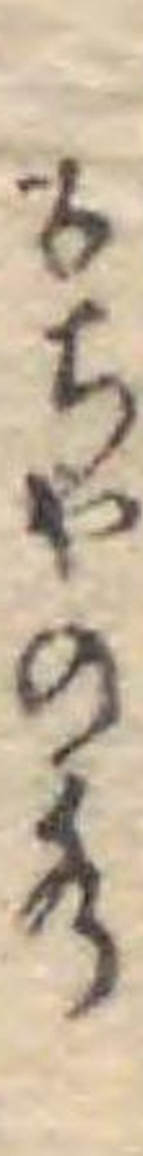おちやの水
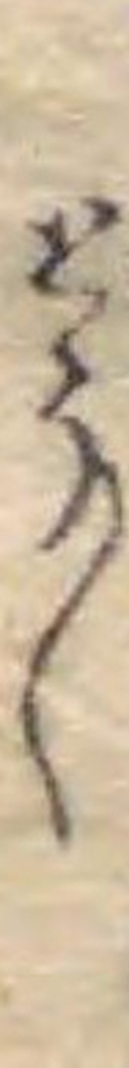とう〳〵
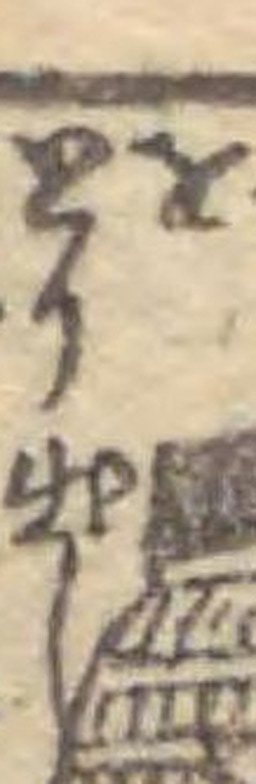とり出し
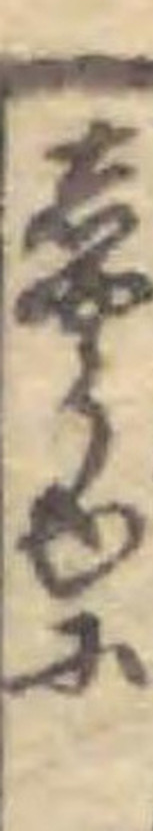しやうゆに
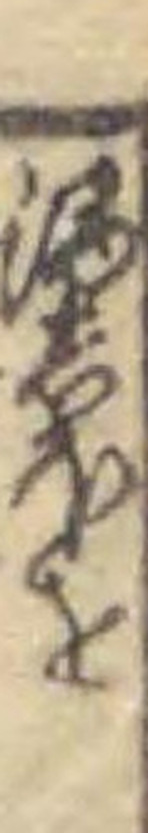酒しほを
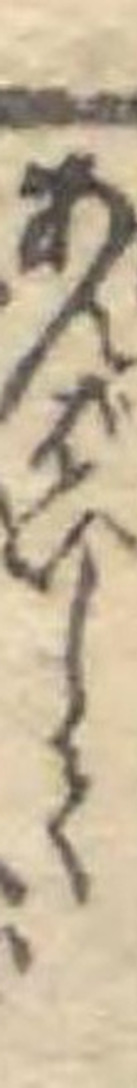あんばいして
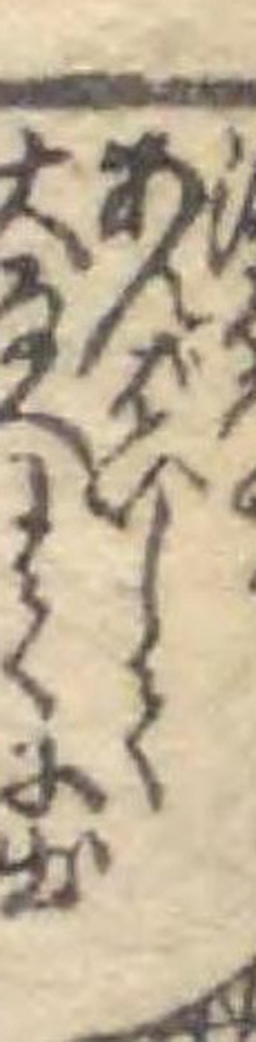大なへにてに出し
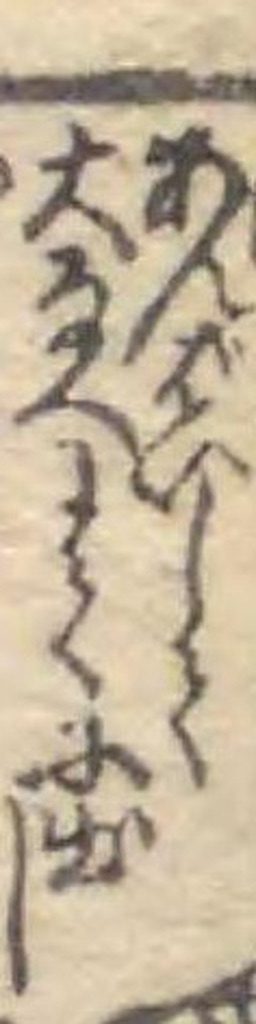大なへにてに出し
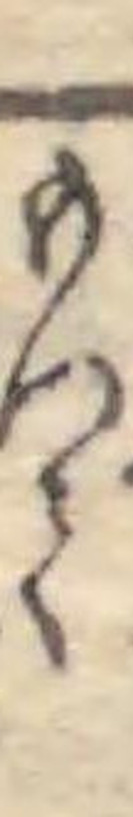もつて
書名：悦贔負蝦夷押領 : 3巻
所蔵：国立国会図書館 National Diet Library, JAPAN
